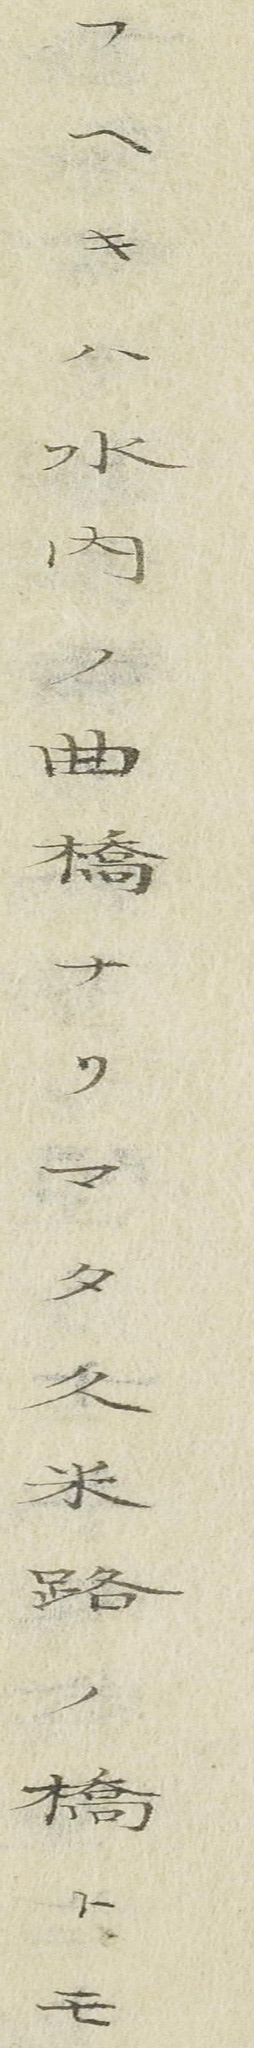フヘキハ水内ノ曲橋ナリマタ久米路ノ橋トモ
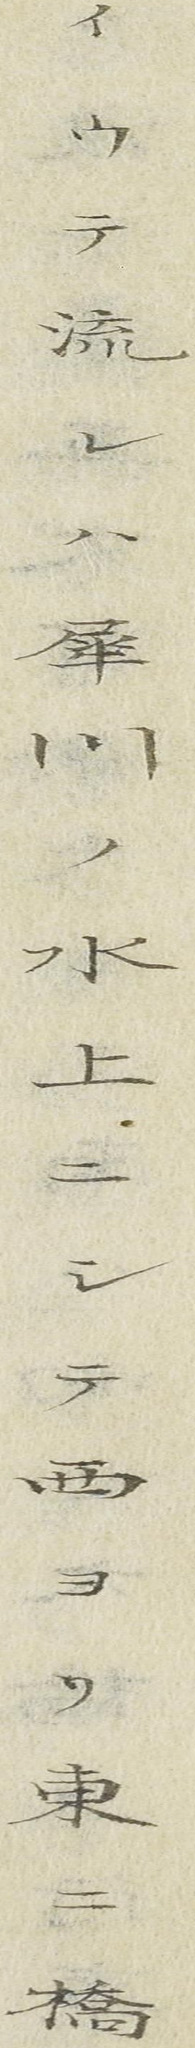イフテ流レハ犀川ノ水上ニシテ西ヨリ東ニ橋

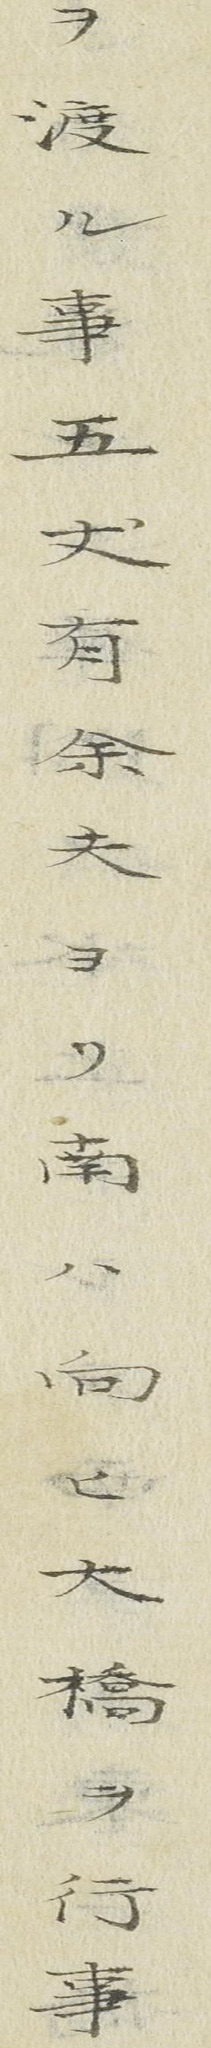ヲ渡ル事五丈有余夫ヨリ南ハ向ヒ大橋ヲ行事
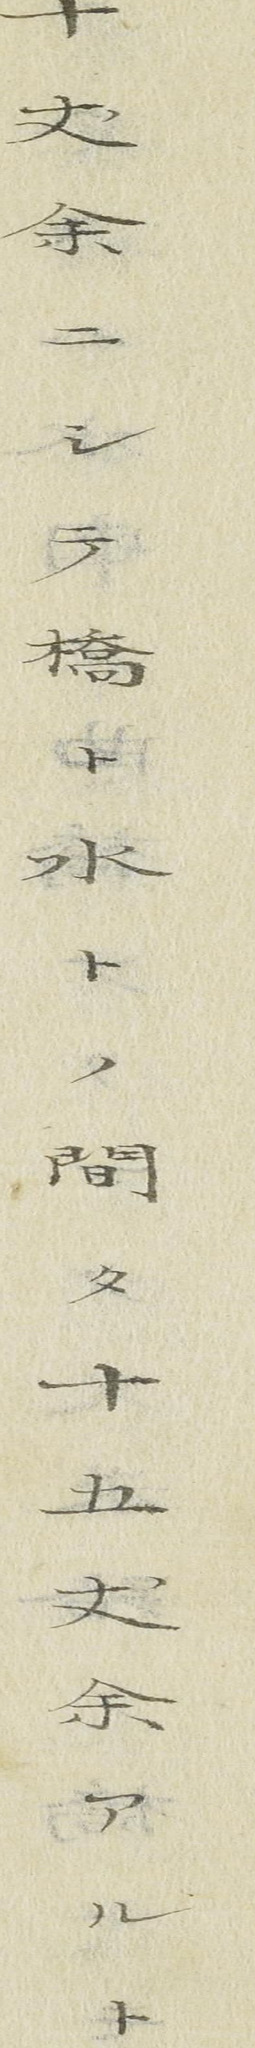十丈余ニシテ橋ト水トノ間タ十五丈余アルト
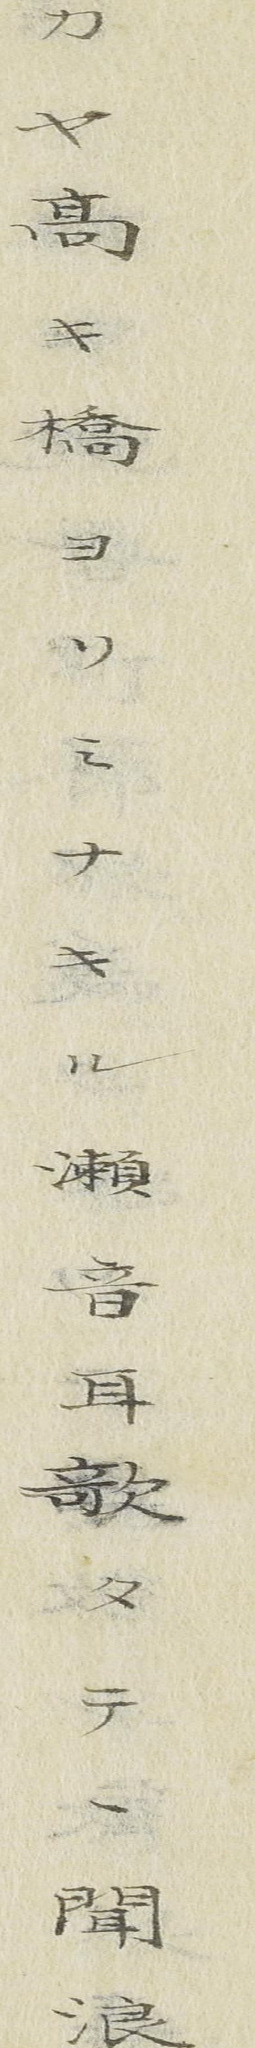カヤ高キ橋ヨリミナキル瀬音耳歌タテヽ聞浪
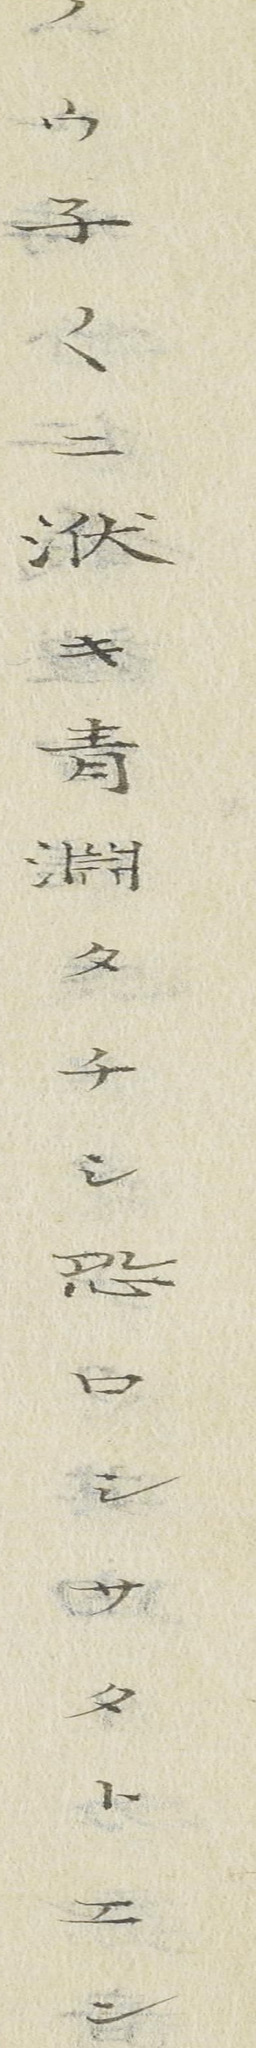ノウ子〱ニ洑キ蒼淵タチシ恐ロシサタトエン
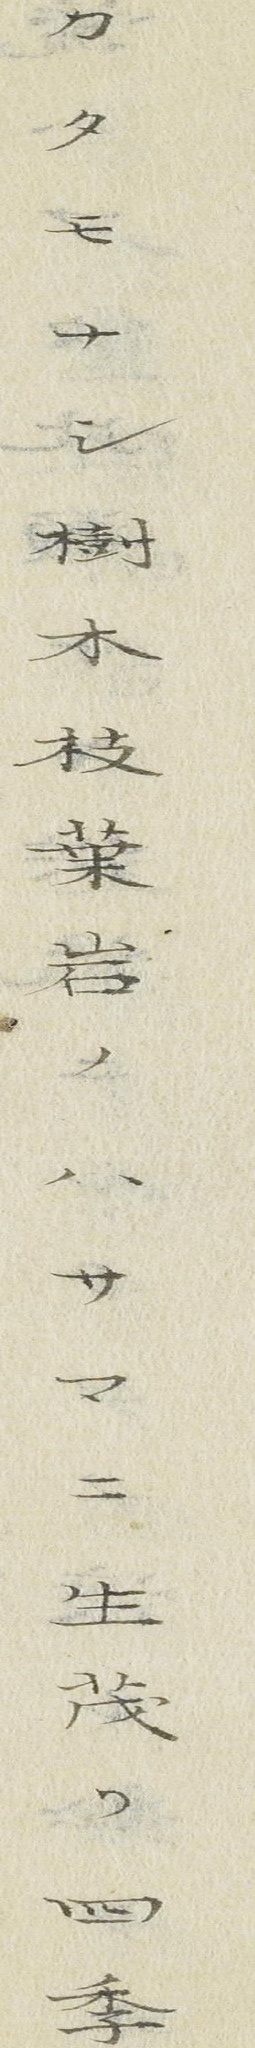カタモナシ樹木枝葉岩ノハサマニ生茂リ四季
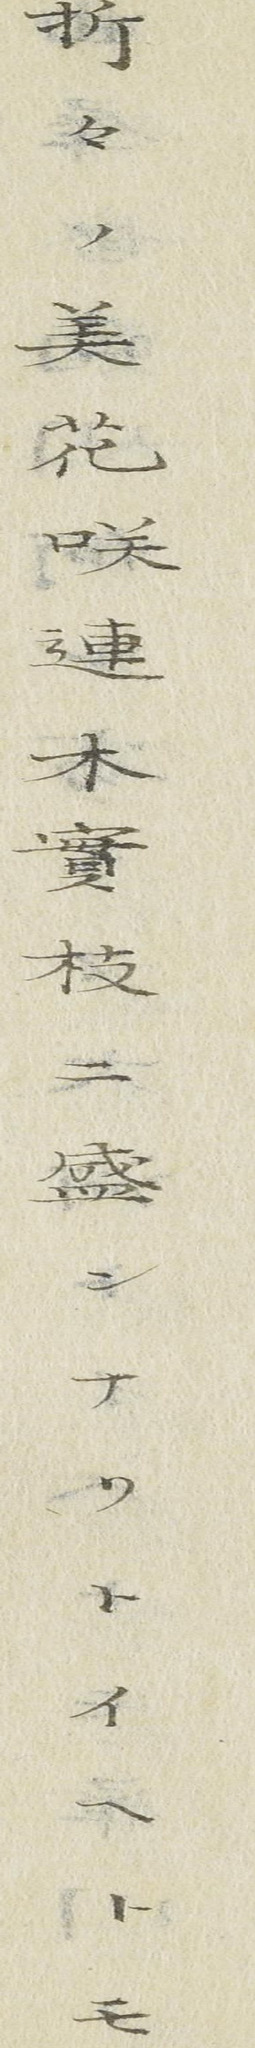折々ノ美花咲連木実枝ニ盛ンナリトイヘトモ
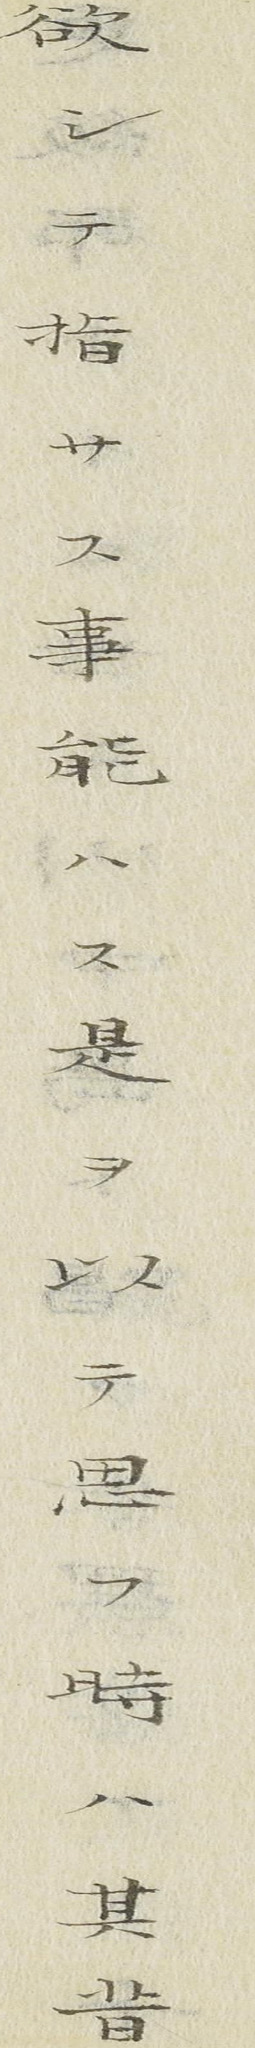欲シテ指サス事能ハス是ヲ以テ思フ時ハ其昔
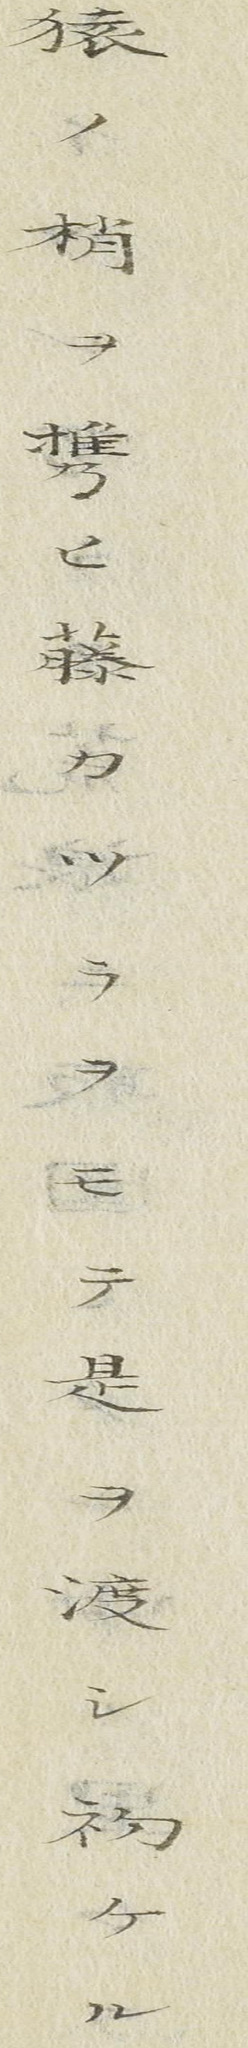猿ノ梢ヲ携ヒ藤カツラヲモテ是ヲ渡シ初ケル
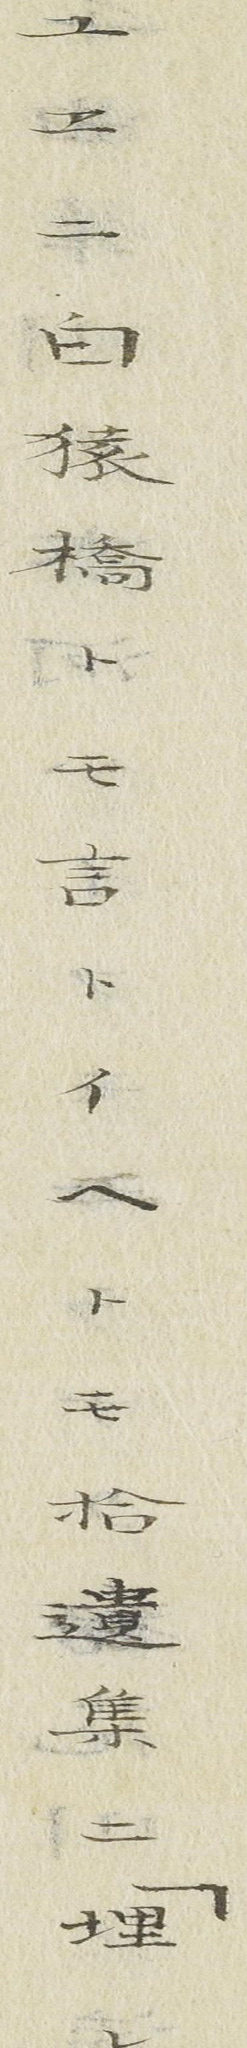ユエニ白猿橋トモ言トイヘトモ拾遺集ニ「埋レ
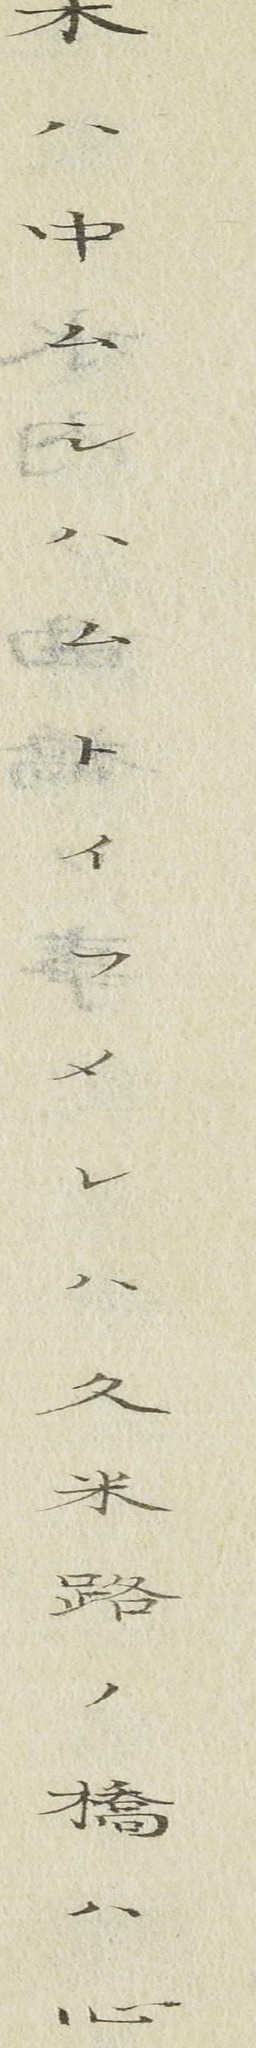木ハ中ムシハムトイフメレハ久米路ノ橋ハ心
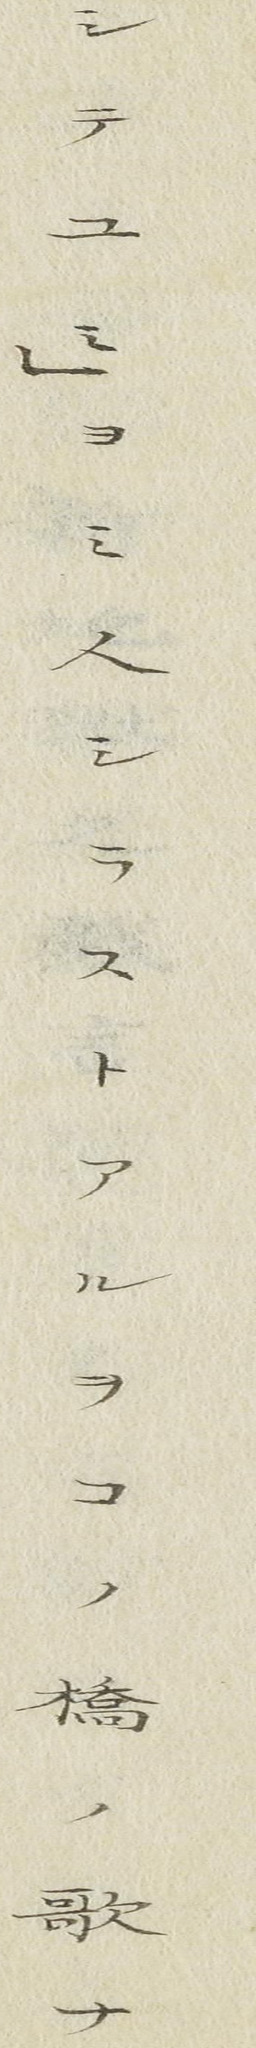シテユミ」ヨミ人シラストアルヲコノ橋ノ歌ナ
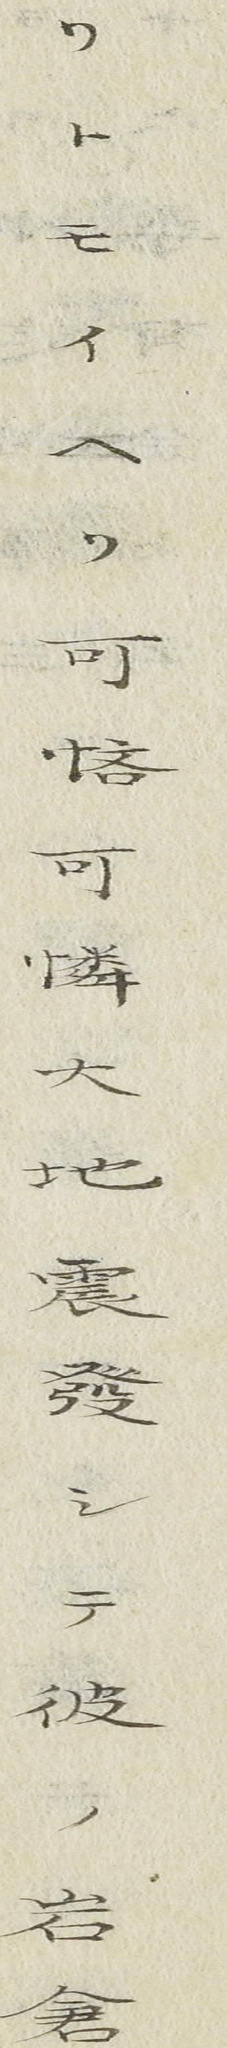リトモイヘリ可悋可憐大地震発シテ彼ノ岩倉
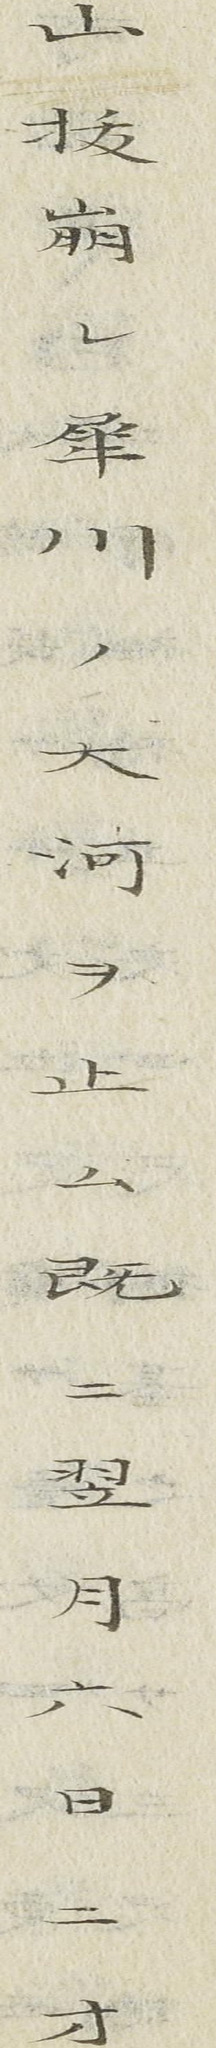山抜崩レ犀川ノ大河ヲ止ム既ニ翌月六日ニオ
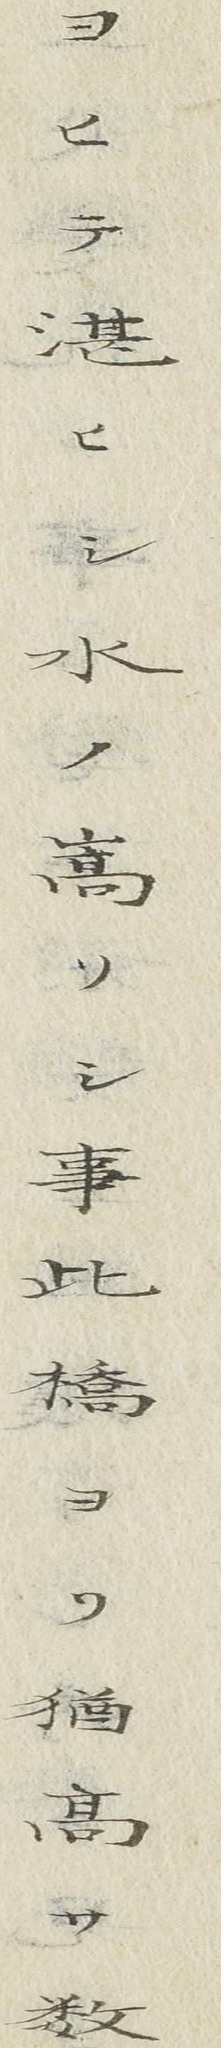ヨヒテ湛ヒシ水ノ嵩リシ事此橋ヨリ猶高サ数
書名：地災撮要　地震之部　巻ノ二
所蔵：東京大学地震研究所図書室 Earthquake Research Institute Library, The University of Tokyo, JAPAN
